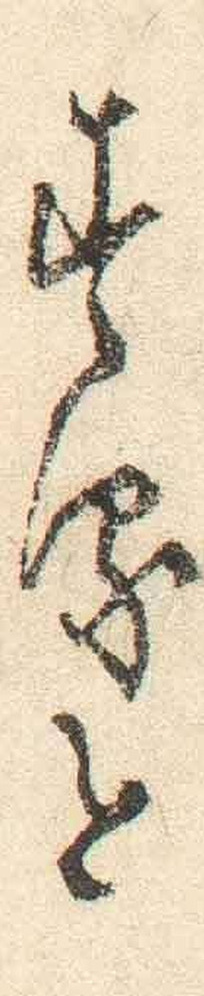すると
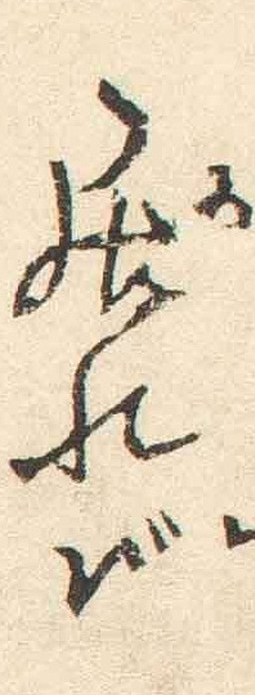居れば
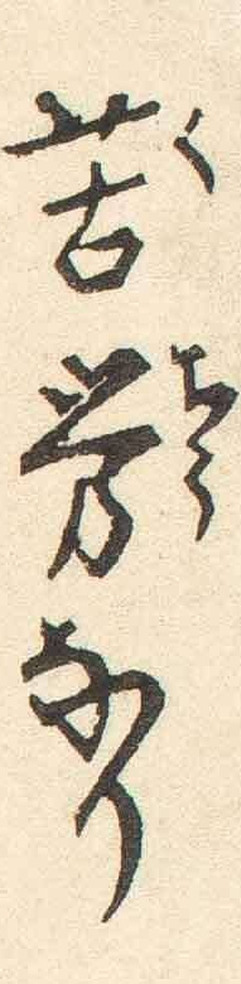苦労なり
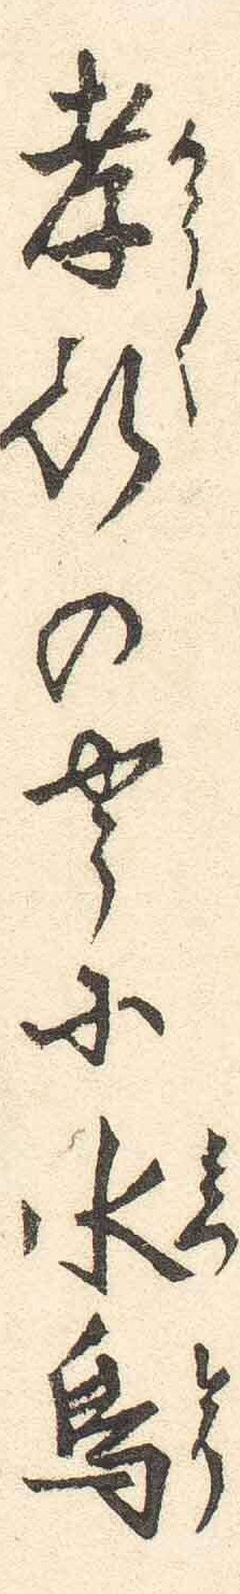孝行のやうに水鳥
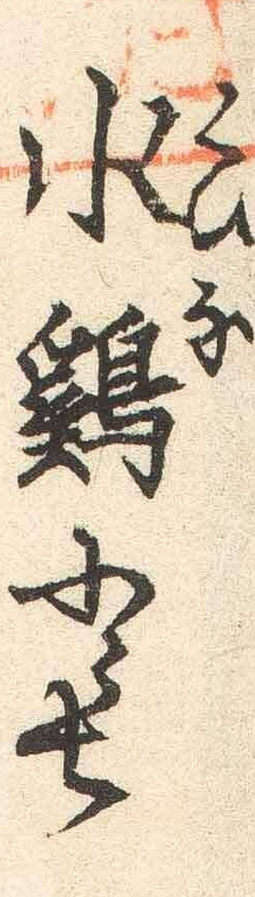水鶏にも
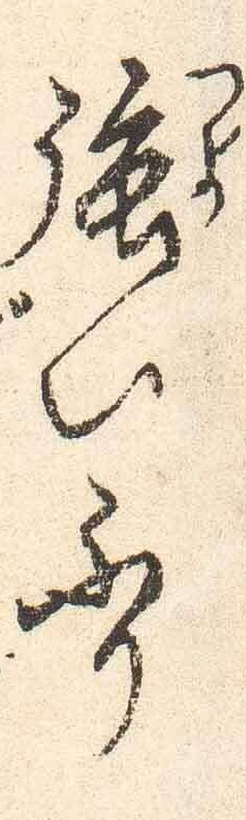強いふり
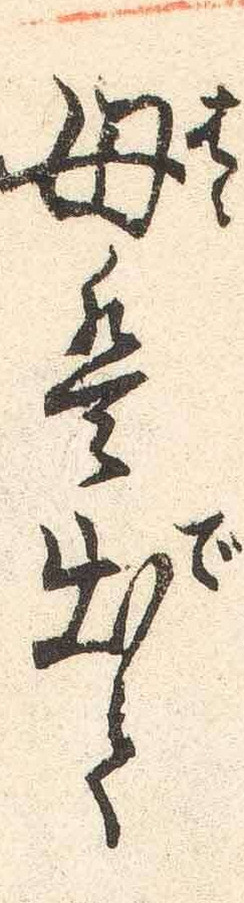母は出て
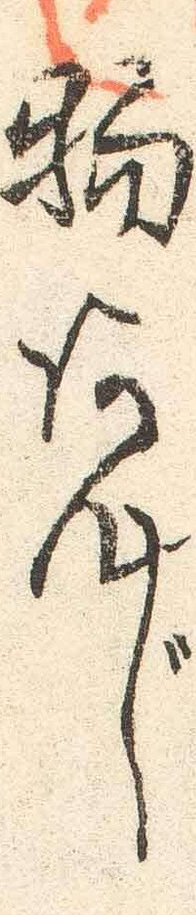物あんじ
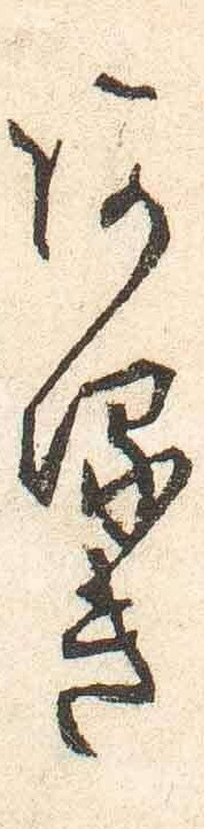あるき
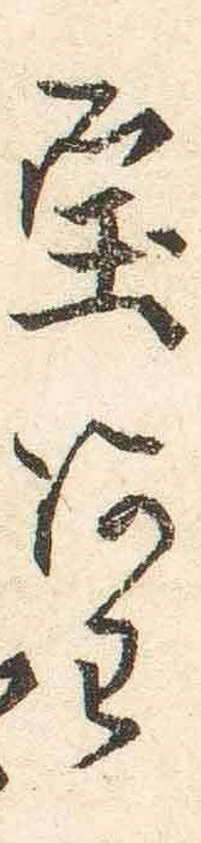宝あわ

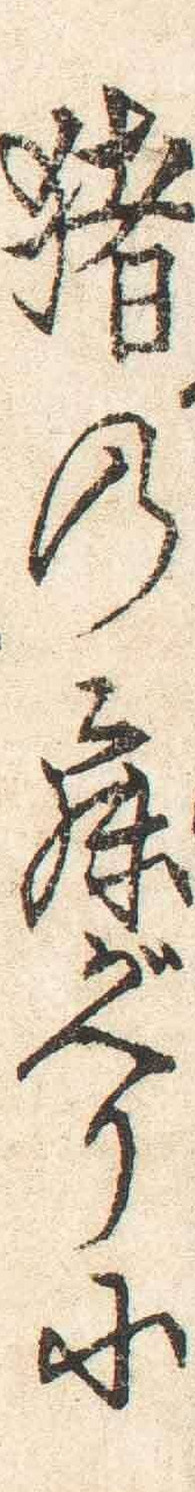猪の寝がへりに
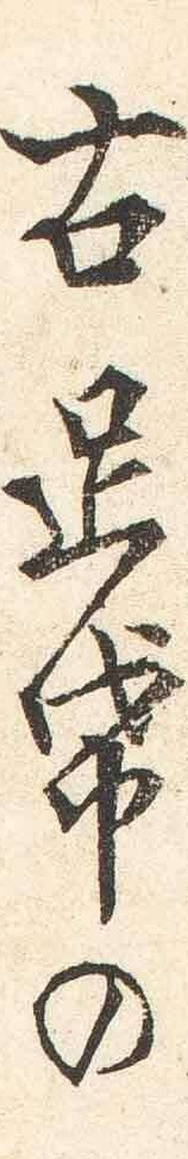古足袋の
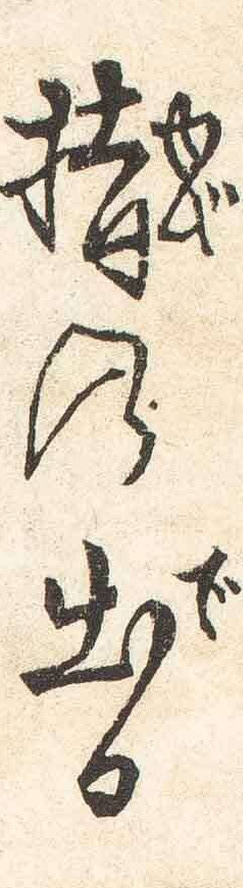指の出る
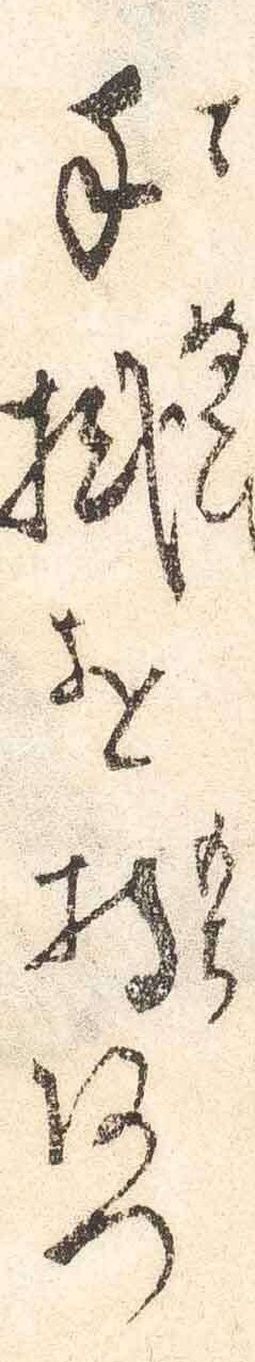手拭を持あつ
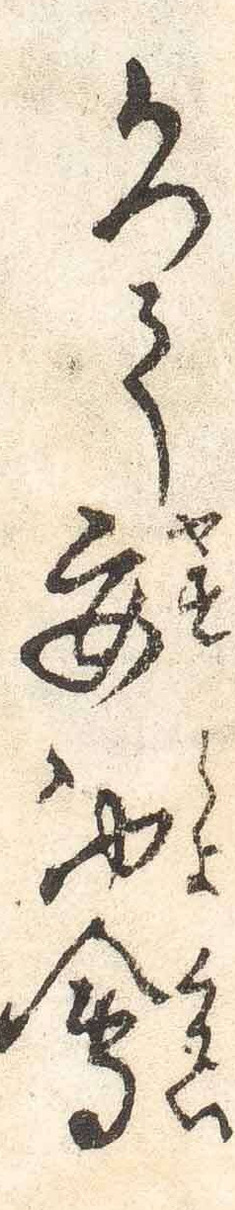かつて安初会
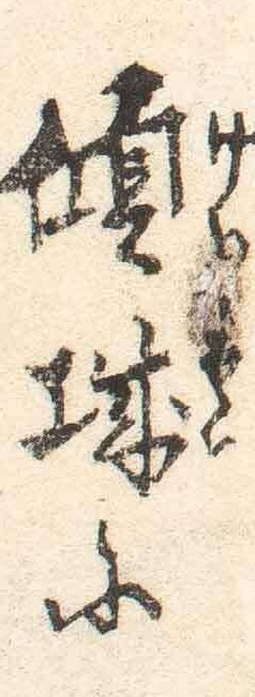傾城に
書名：画本柳樽
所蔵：東京学芸大学附属図書館 国文学研究資料館
